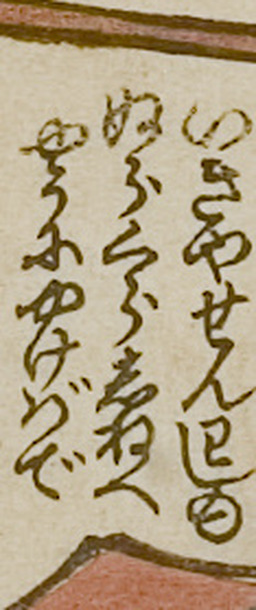ぬらくらしねへ
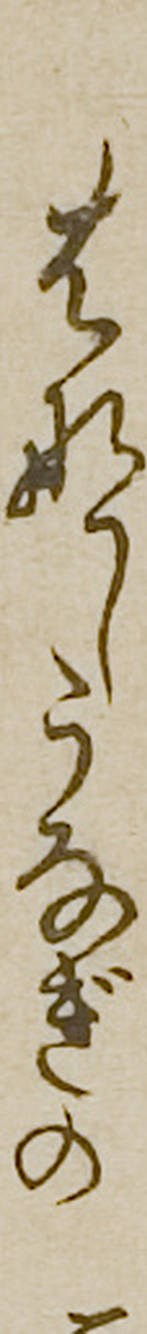はなしうなぎの
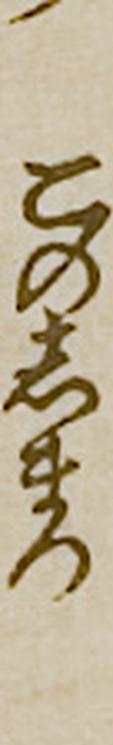このしまつ
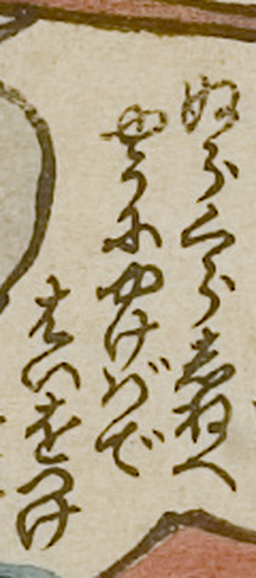やうにやけバで
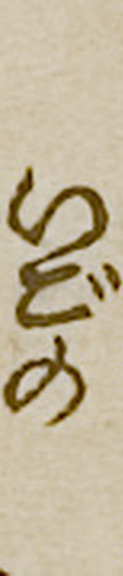いごの
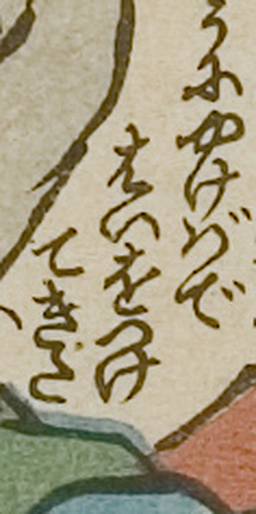はいをつけ
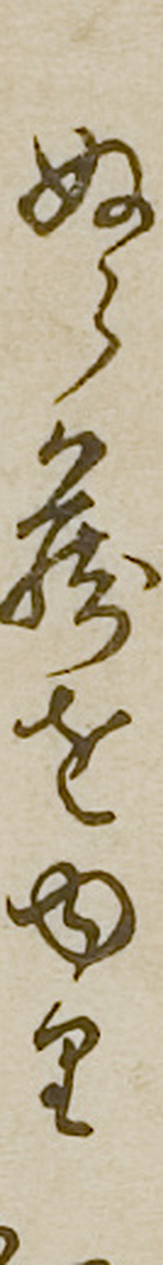ぬら蔵をゆり
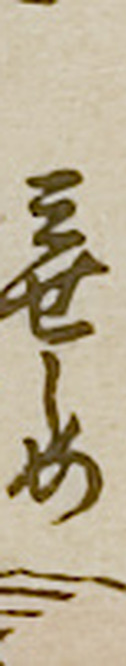ミせしめ
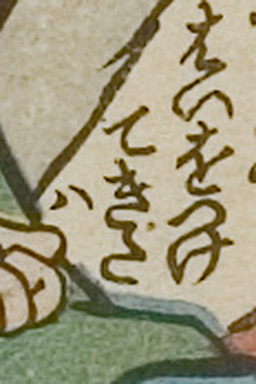てきた
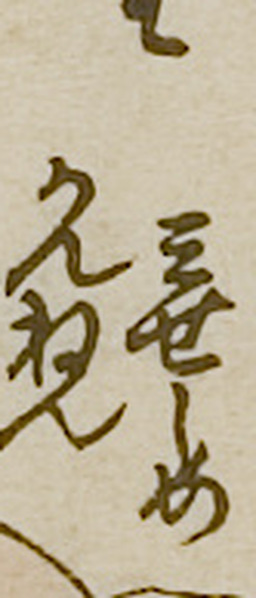かんねん
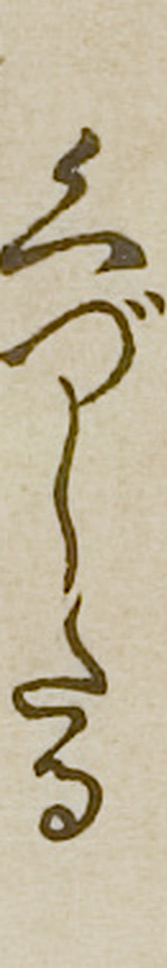くずしたる
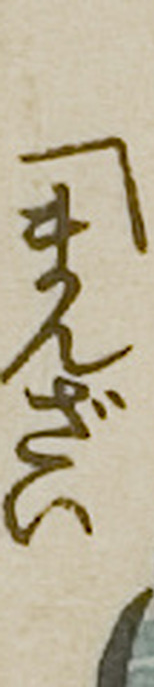〽まんざい
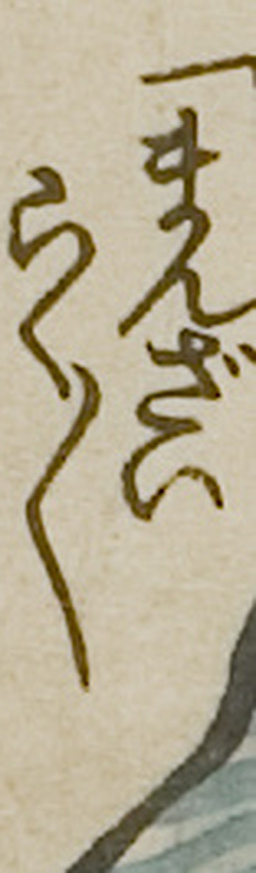らく〳〵
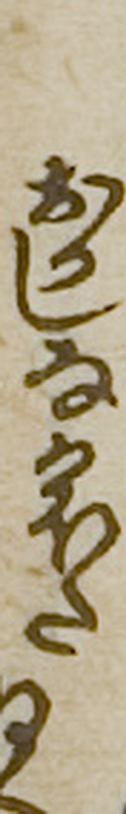おかしなかほた
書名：[鯰と鹿島大明神の首引]
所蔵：東京大学総合図書館 General Library in the University of Tokyo, JAPAN
